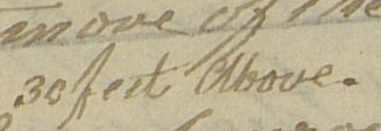30 feet Above.
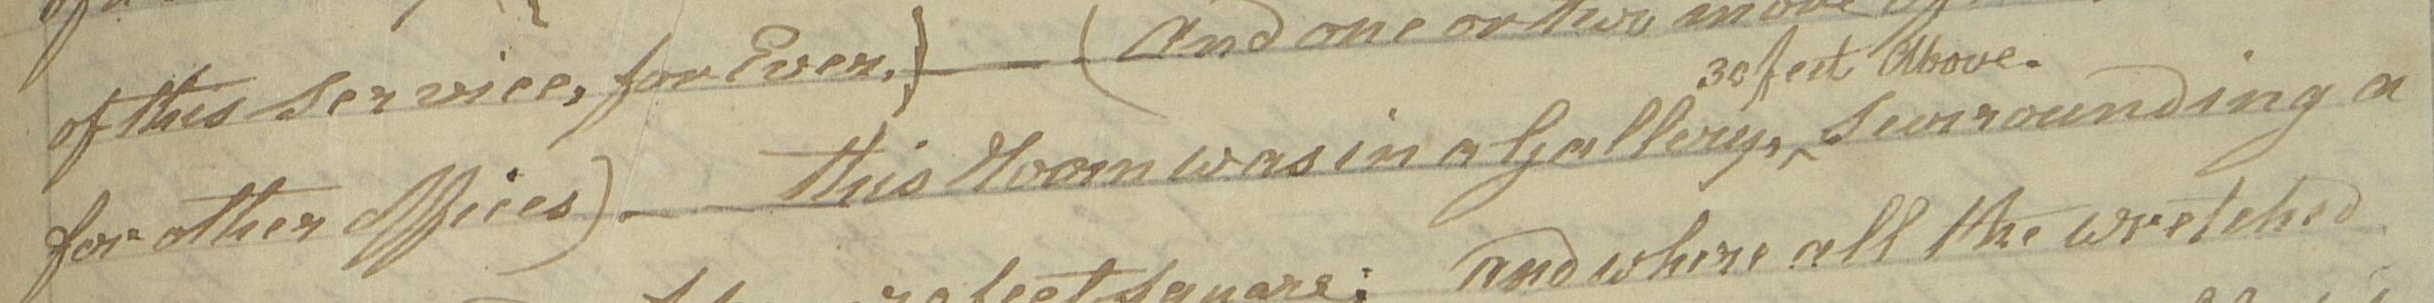for other offices) This room was in a Gallery, ^ surrounding a
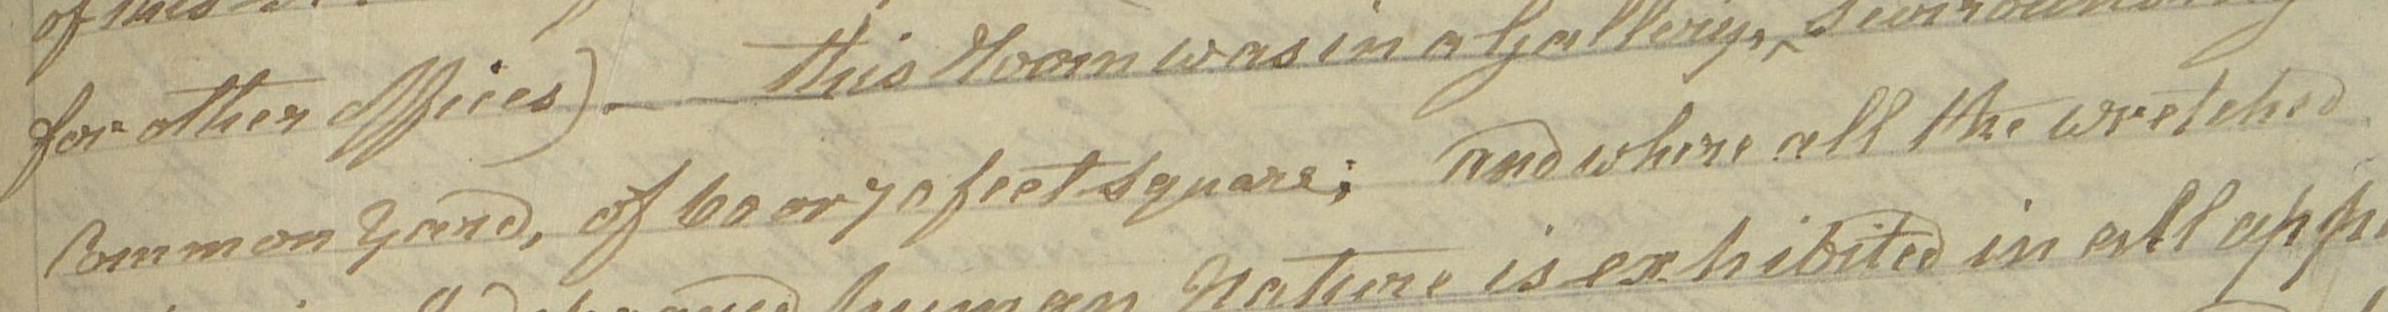Common Yard, of 60 or70 feet Square; and where all the wretched
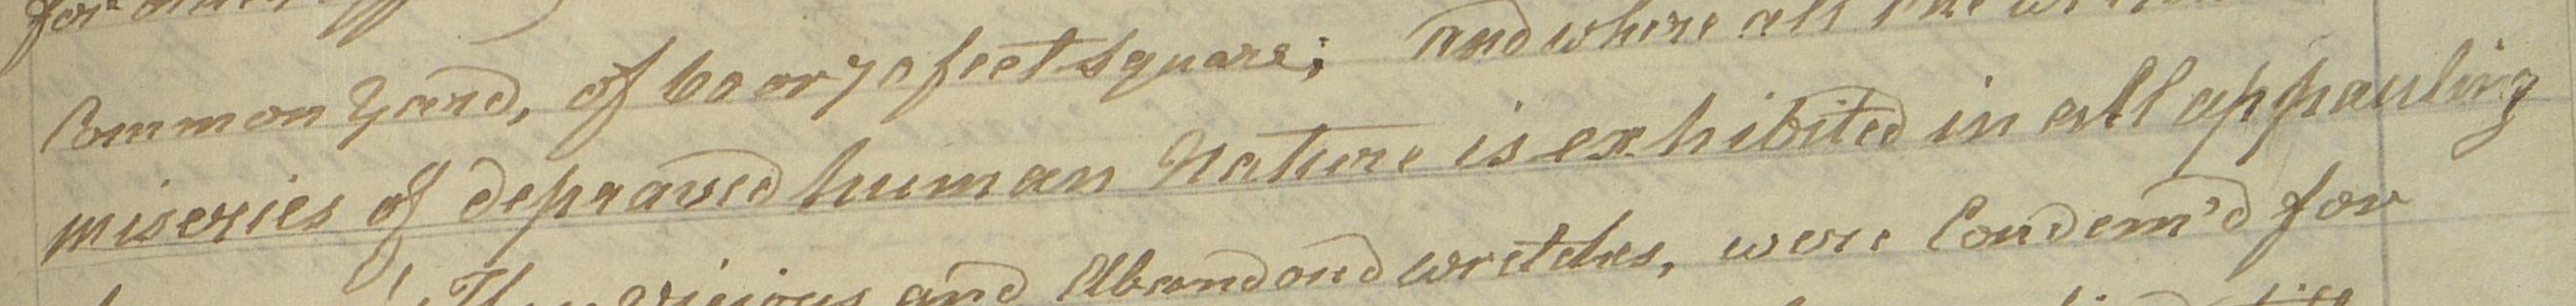miseries of depraved human Nature is exhibited in all appauling
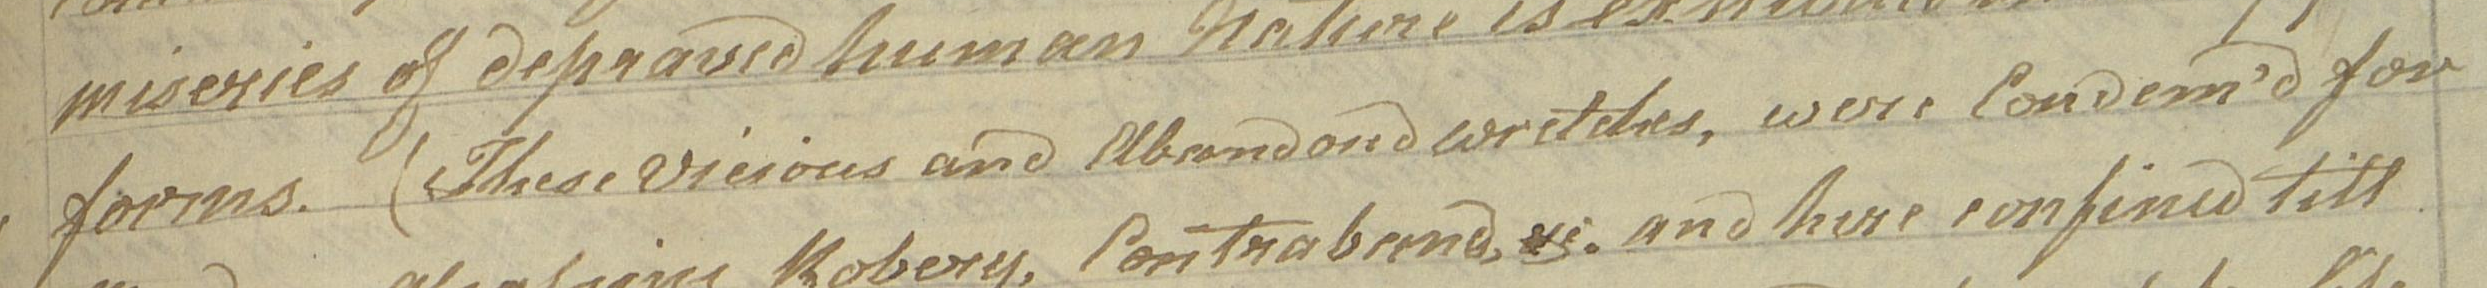forms. (These Vicious and Abandond Wretches, were Condem'd for
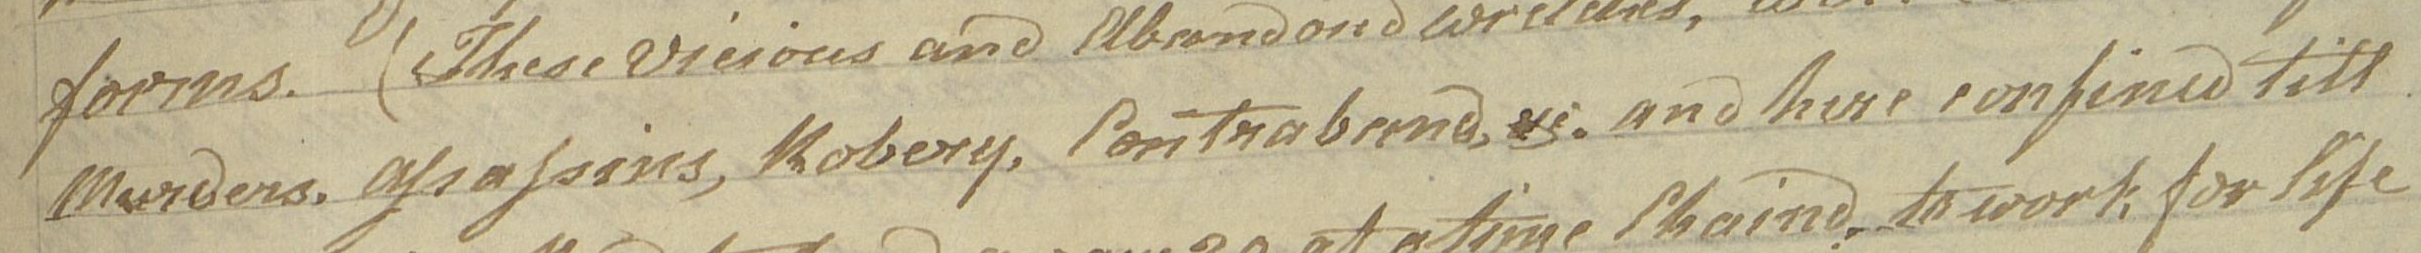Murders. Assassins, Robery, Contraband &^c. and here confined till
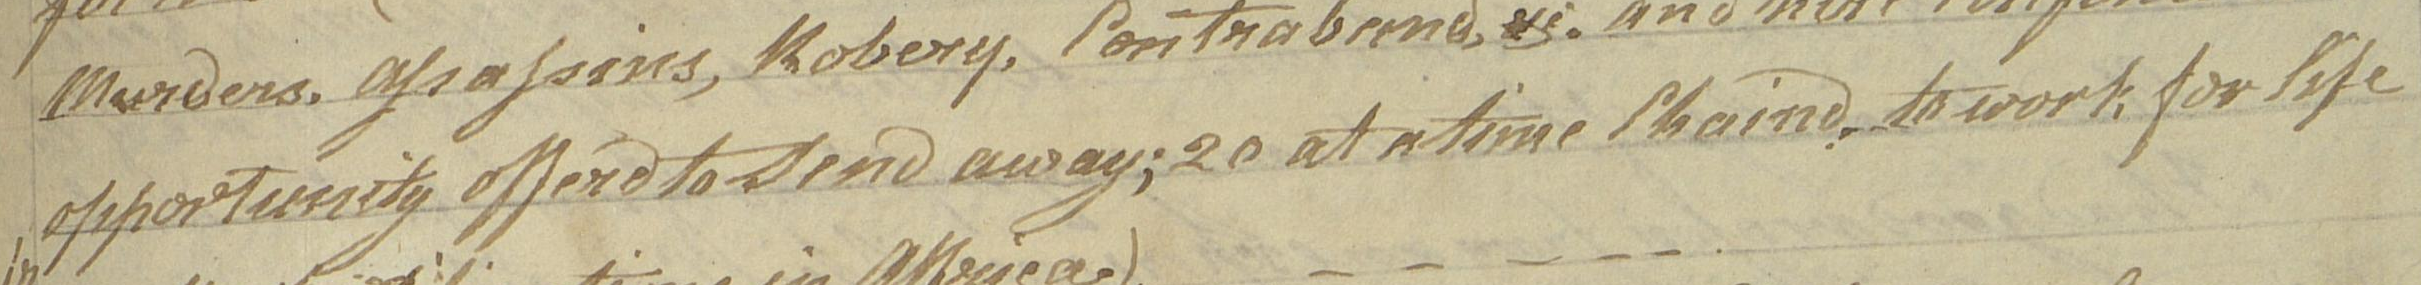opportunity offerd to send away; 20 at a time Chaind to work for life
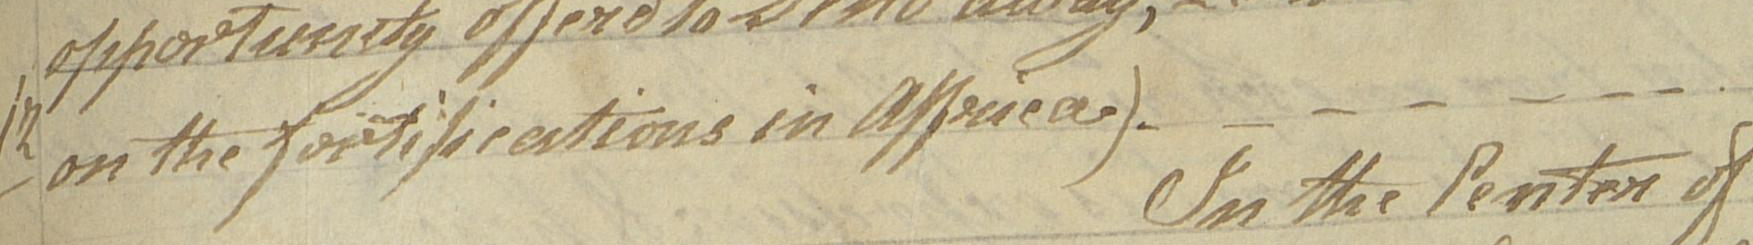on the fortifications in Affrica).
